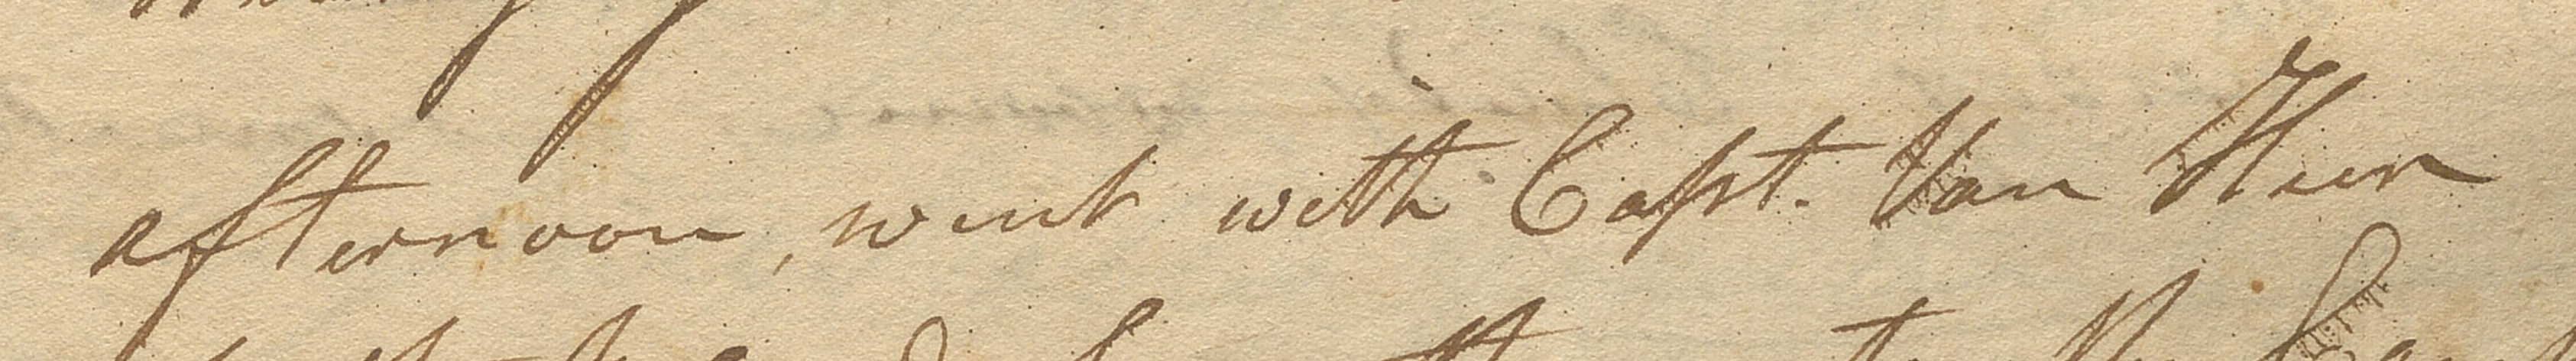afternoon, went with Capt. Van Heer
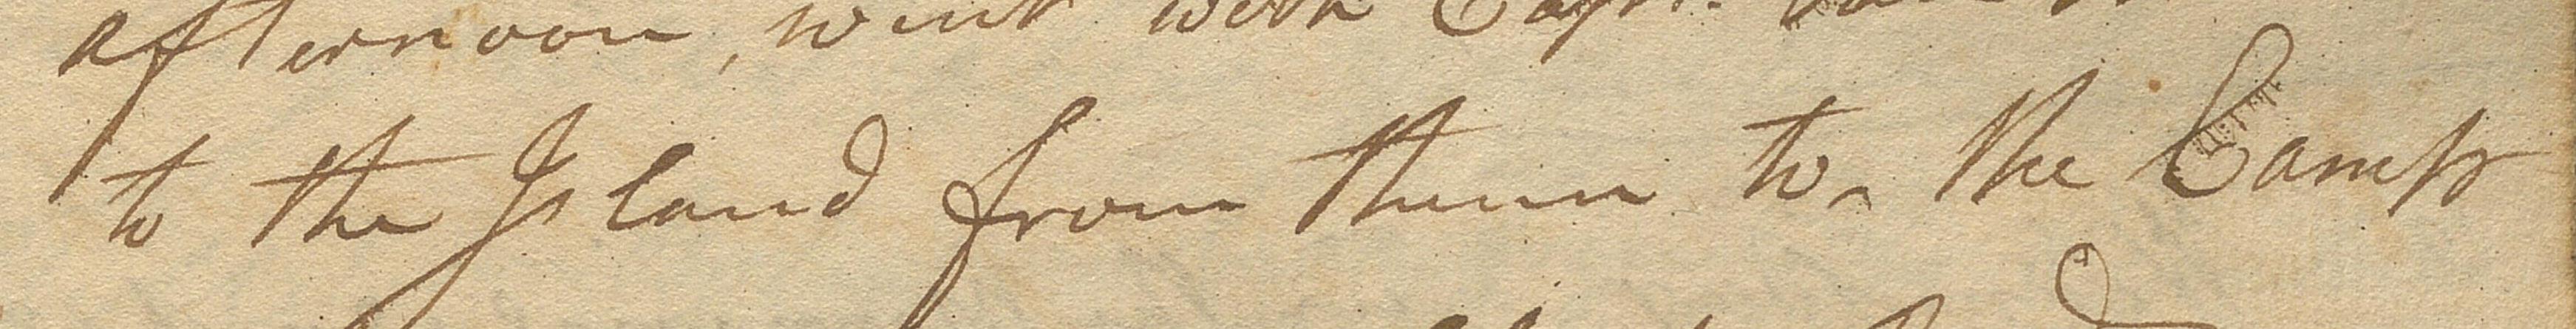to the Island from thence to the Camp
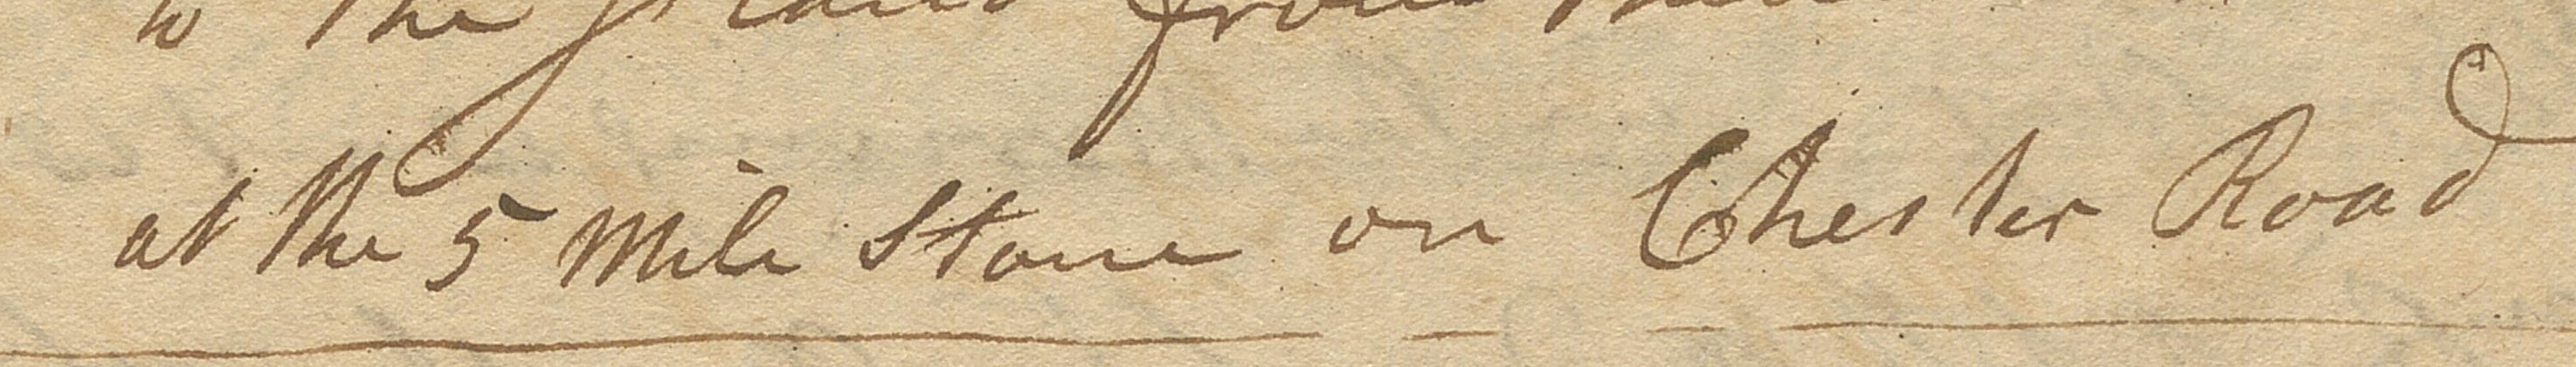at the 5 Mile Stone on Chester Road
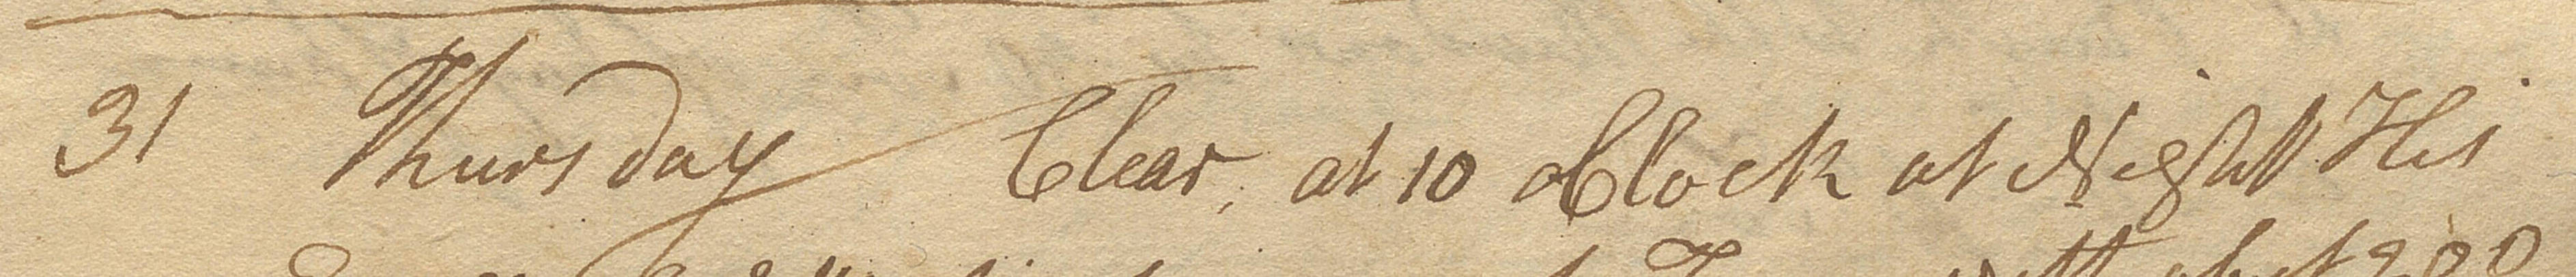31 Thursday Clear, at 10 oClock at Night His
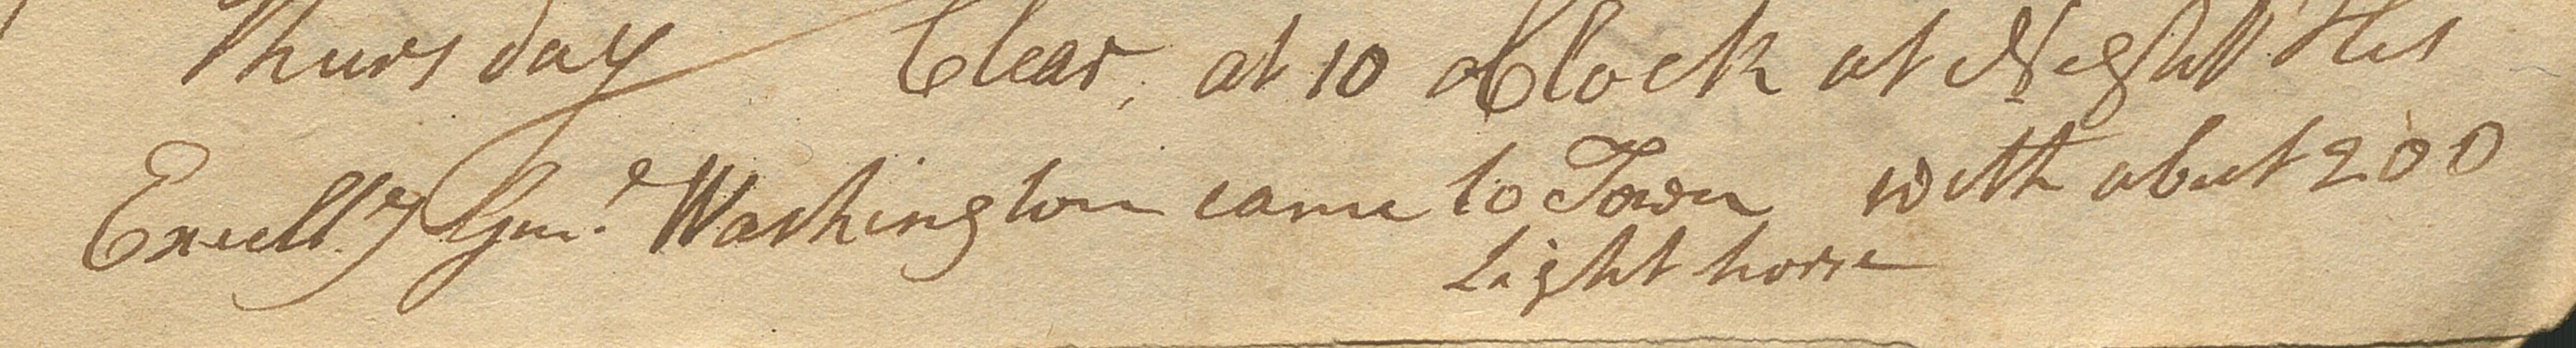Excell^y Gen^l. Washington came to Town, with abut 200
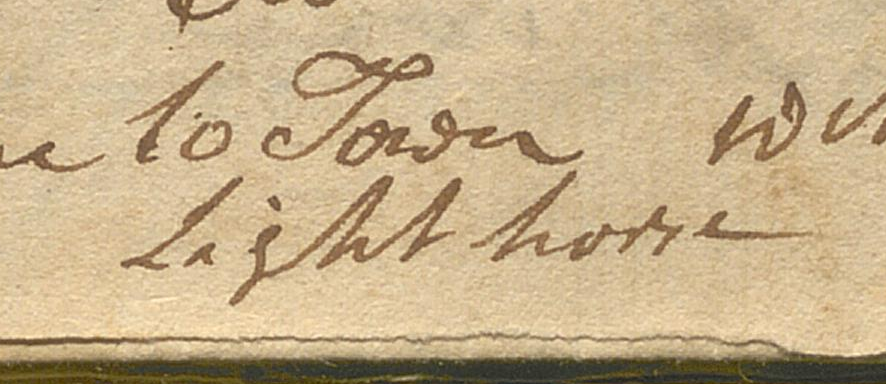Light horse
